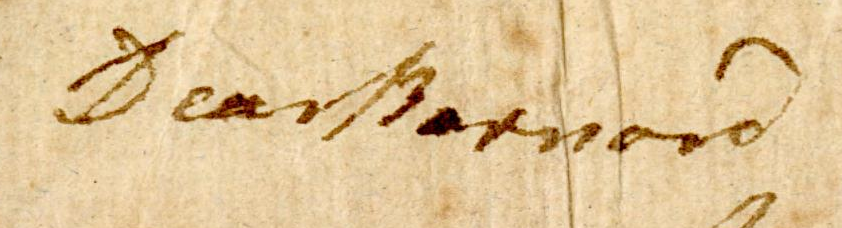Dear Barnard
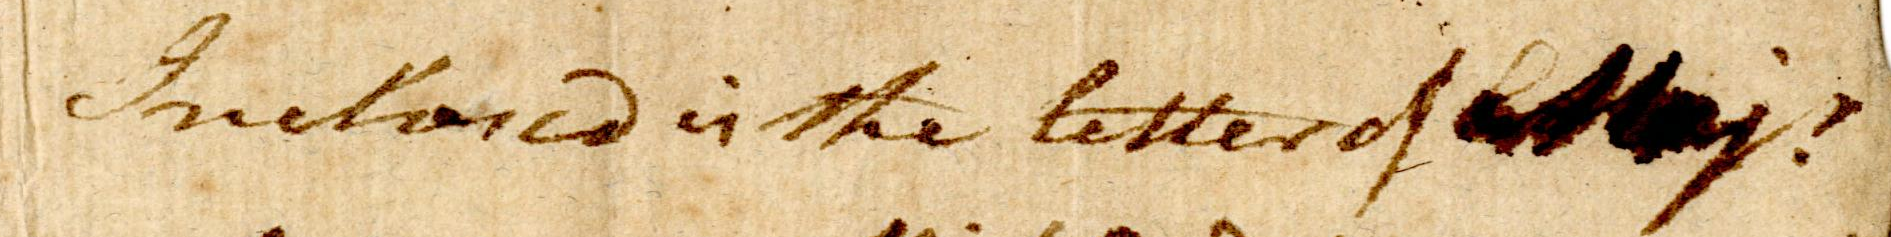Inclosed is the letter of Maj^r
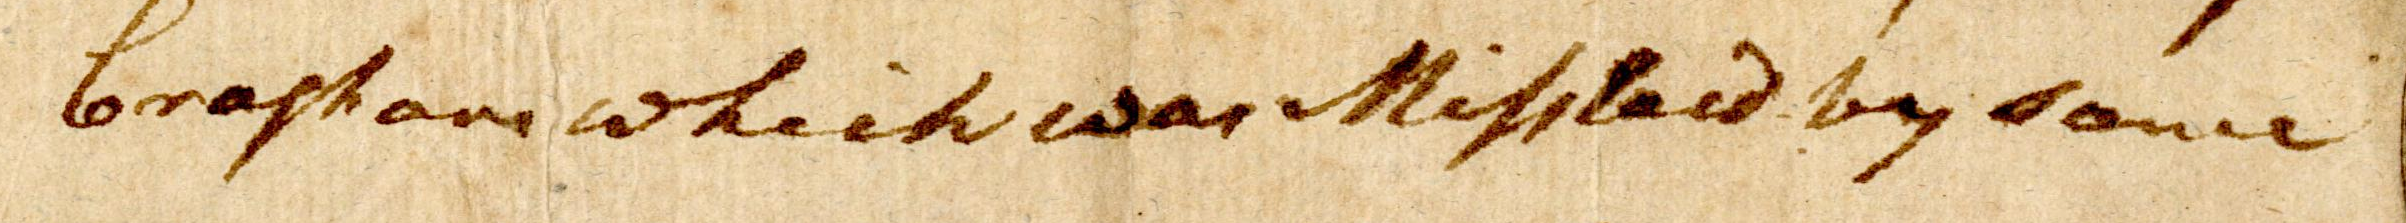Croghan which was Misslaid by some
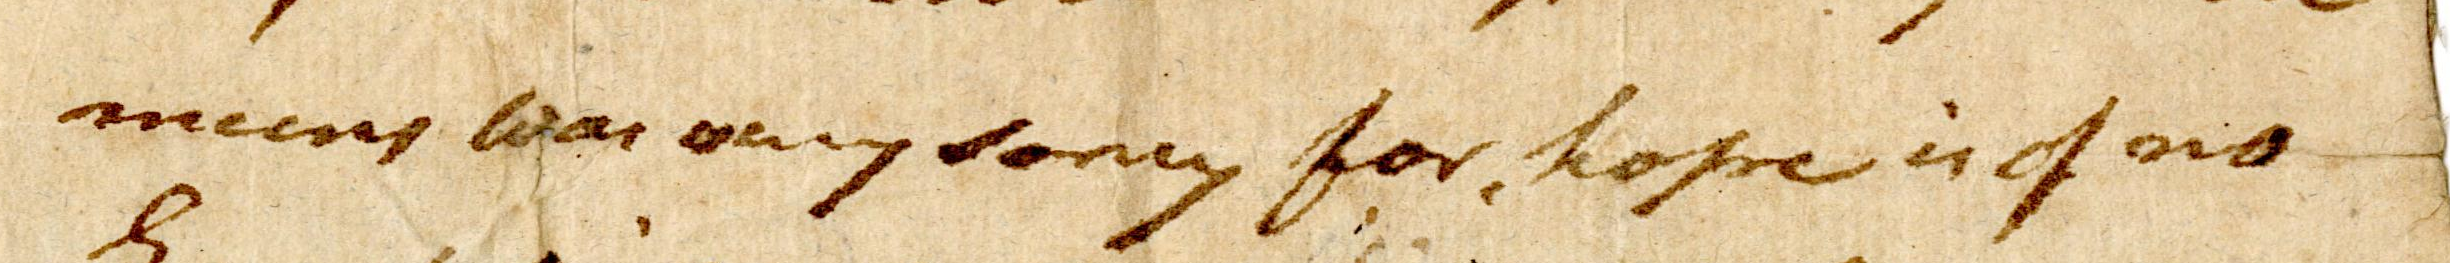means was very sorry for. hope is of no
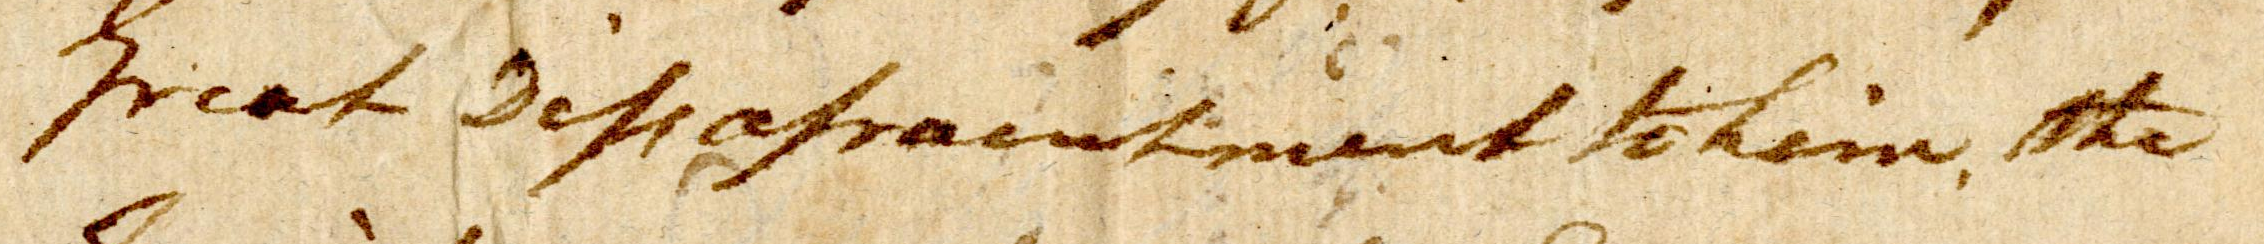great Dissapointment to him, the
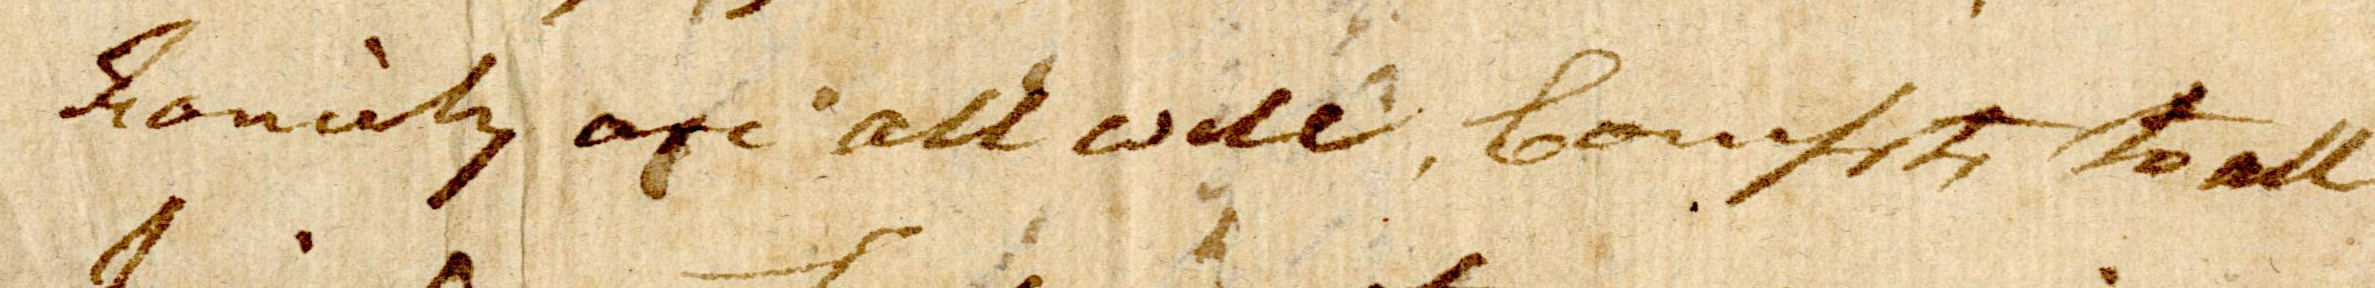Family are all well, Compts to all
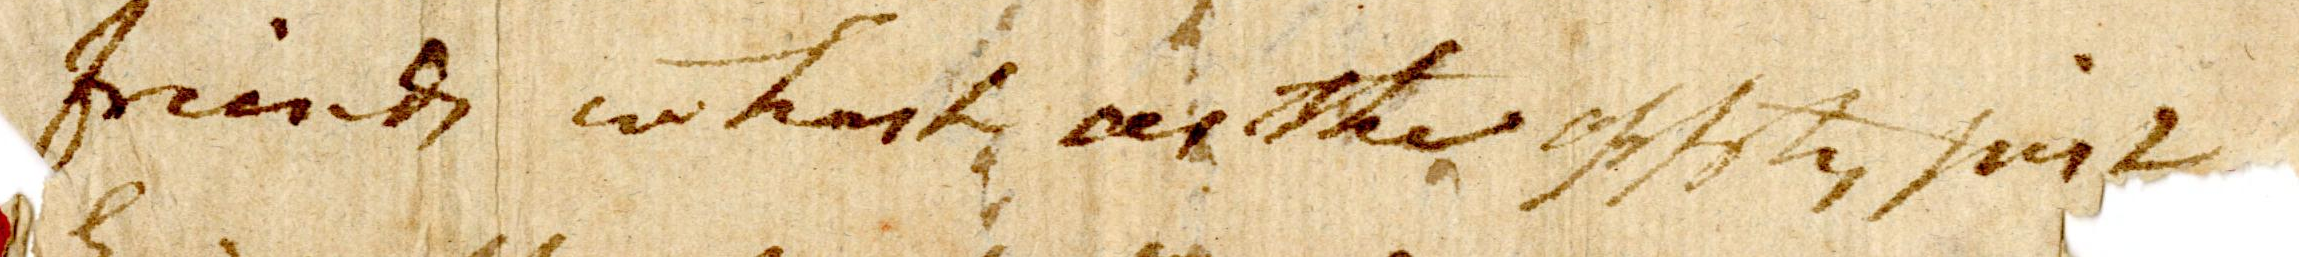friends what are the opp^ty just
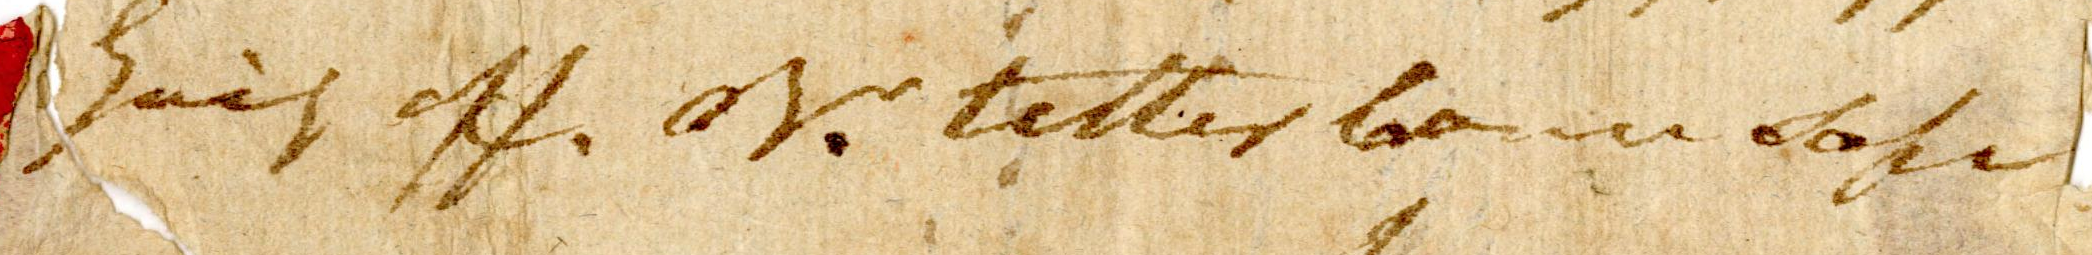Going off. Y^r. Letter Cause safe
